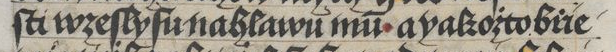ſti wzeſlyſu nahlawu mu.a yakożto bṙíe¬
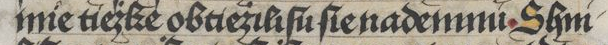mie tieżke obtieżiliſu ſie nademnú.Shni¬
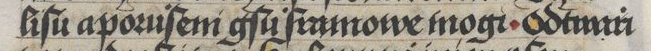liſu a poruẛení gſu ẛramowe mogi.Odtwaṙi
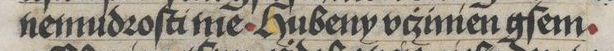nemudroſti nie.Hubeny vcżinien gſem.
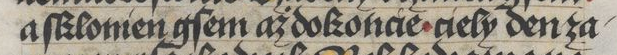a ſkloníen gſem aż dokoncie.ciely den za¬
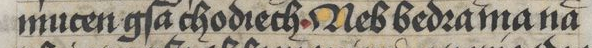mucen gſa chodiech.Neb bedza ma na
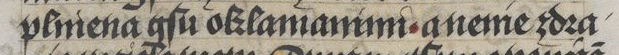plniena gſu oklamaními.a neníe zdra¬
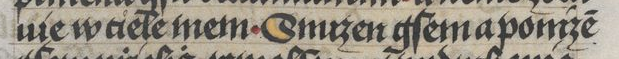uíe w tiele mem.Snuzen gſem a ponízē
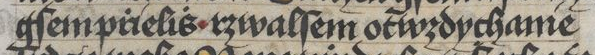gſem pṙíeliṡ.rzwalſem otwzdychaníe
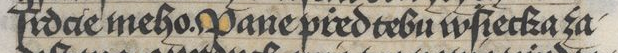ſrdcie meho.Pane pṙed tebu wẛiecka za¬
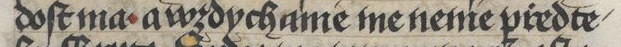doſt ma.a wzdychanie me neníe pṙedte¬
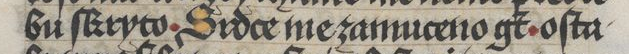bu ſkryto.Srdce me zamuceno ḡt.oſta¬
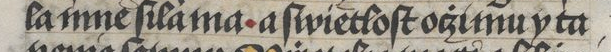la mne ſila ma.a ſwietloſt ocżí mu y ta
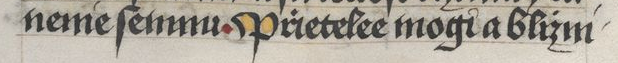neníe ſemnu.Pṙietelee mogi a bliżní¬
